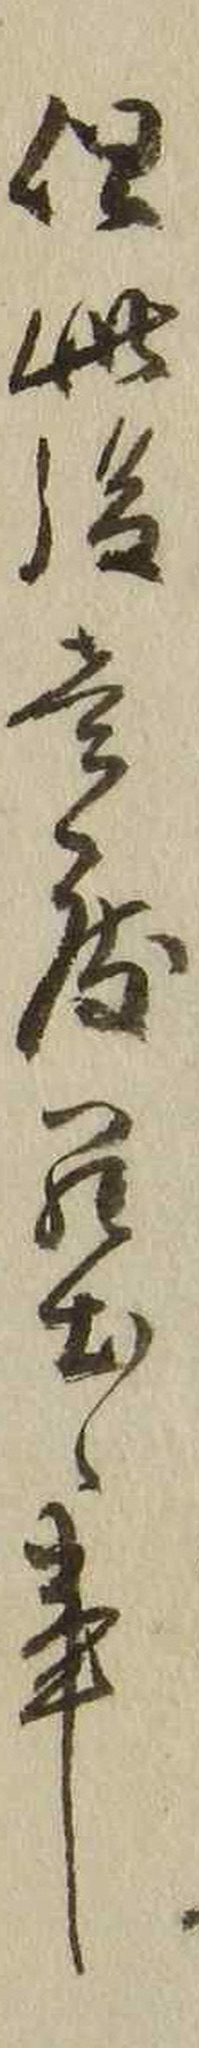但此後壱度罷出候事
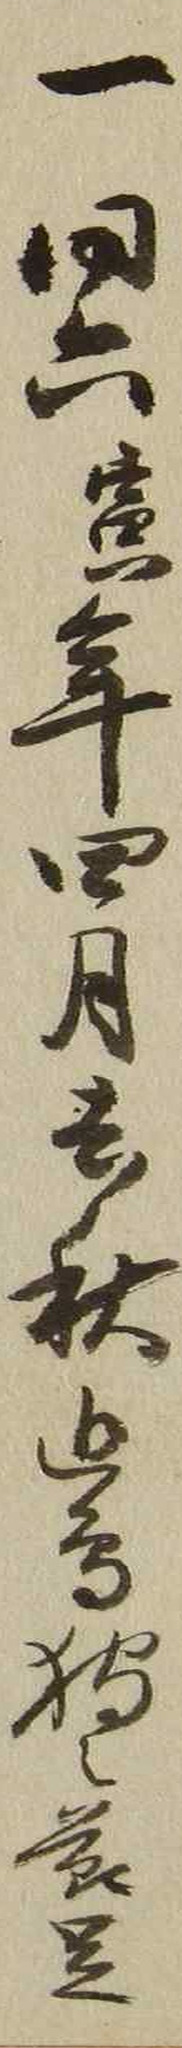一同六寅年四月去秋追鳥狩之節足
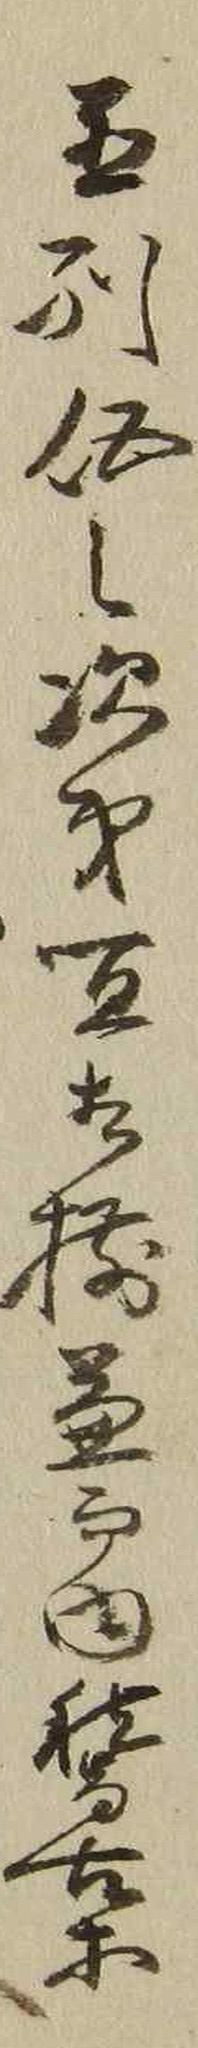並列伍之次第宜相揃兼而内稽古等
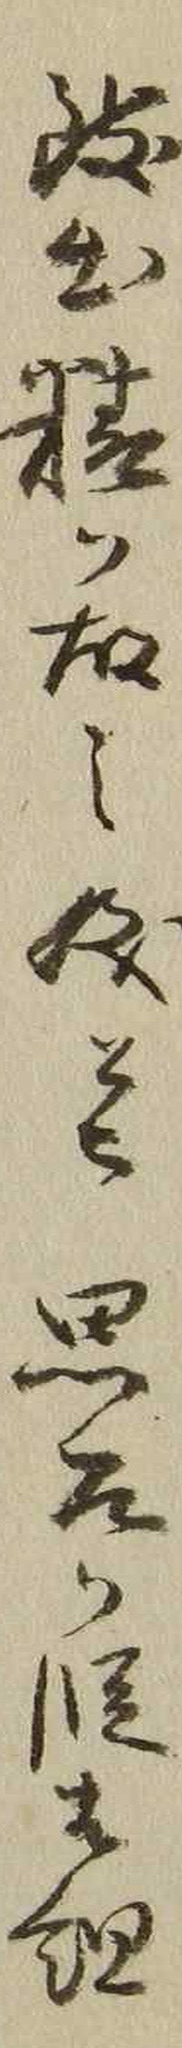致出精候故之儀と被思召候段相組
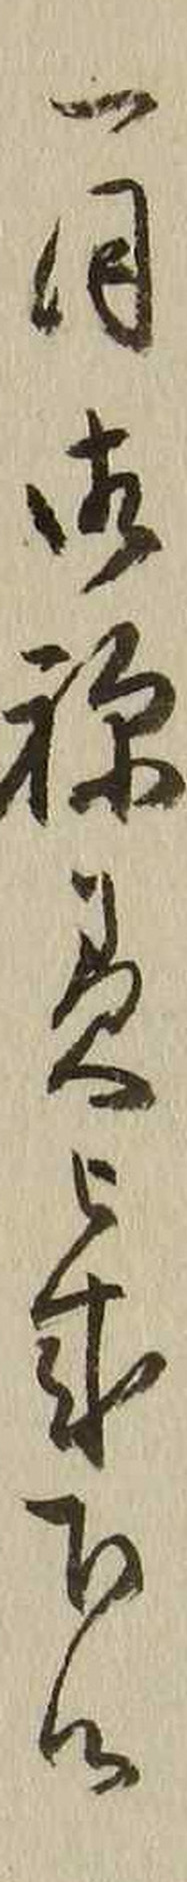一同御称美被成下候
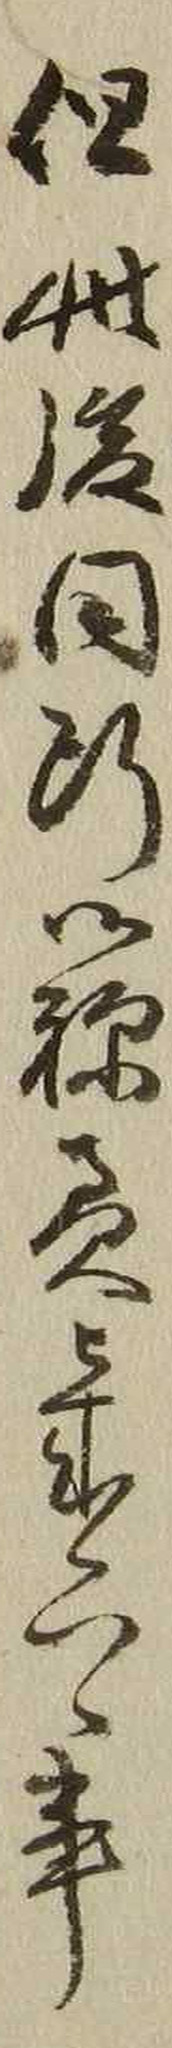但此後同断御称美被成下候事
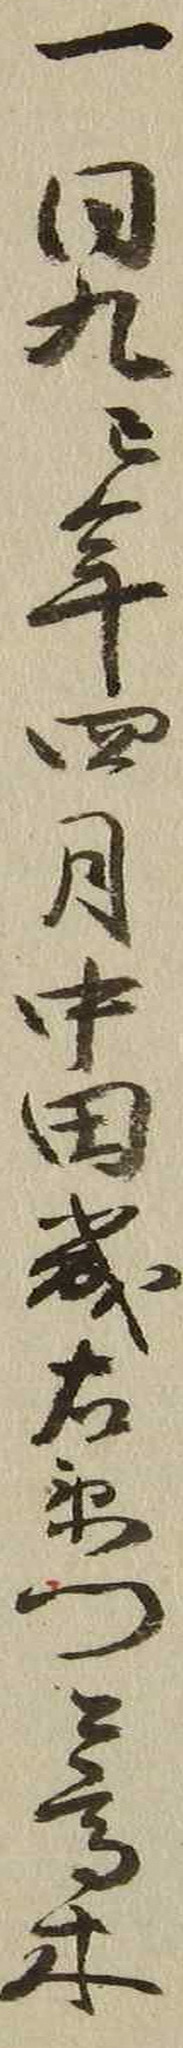一同九巳年四月中田幾右衛門と高木
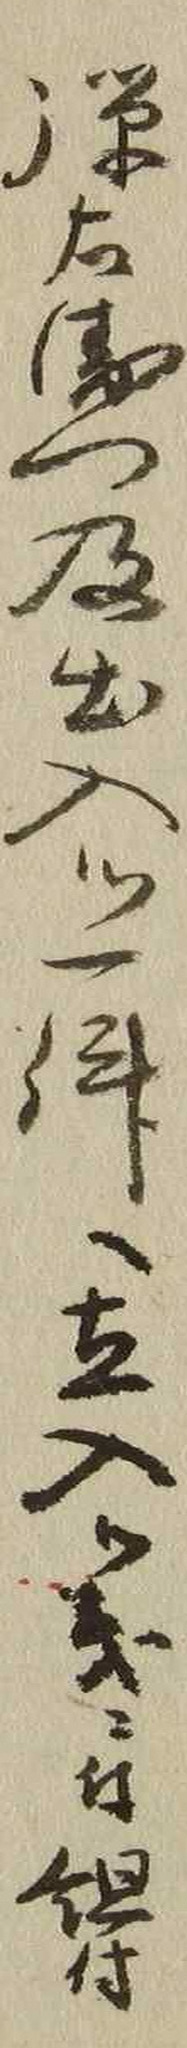弾右衛門及出入候一件へ立入候義ニ付組付
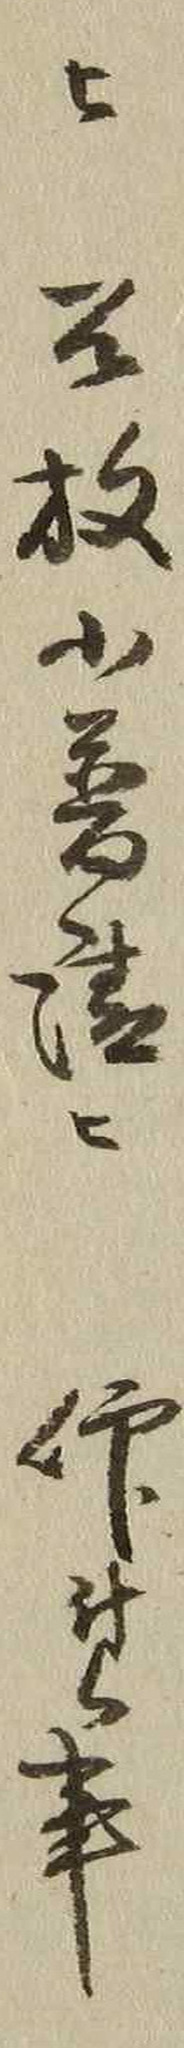被召放小普請被仰付候事
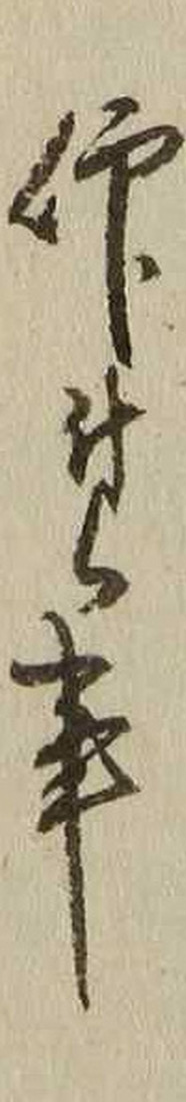仰付候事
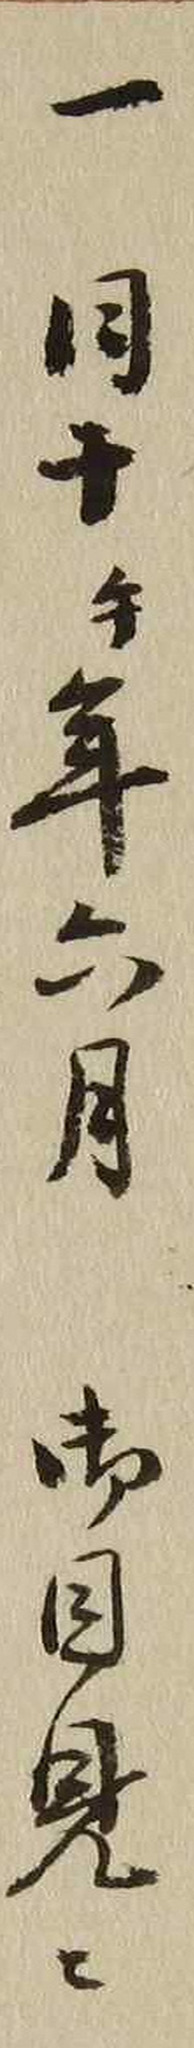一同十午年六月御目見被
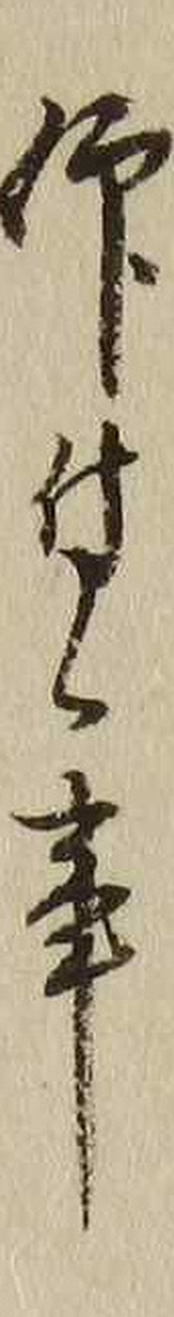仰付候事
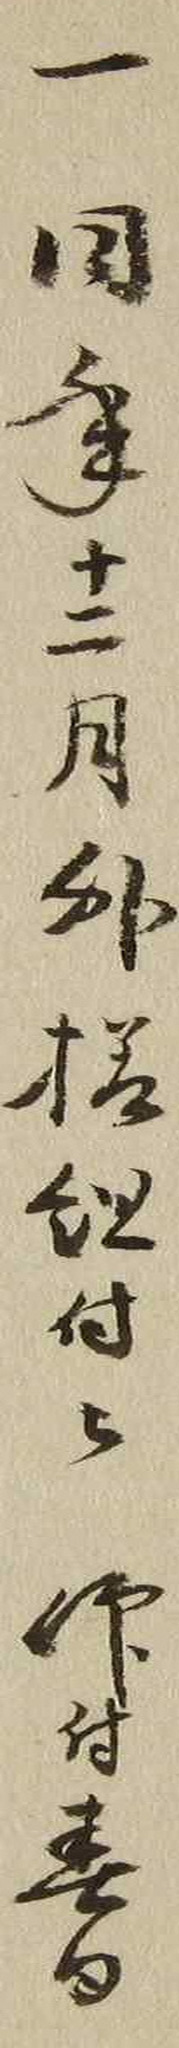一同年十二月外様組付被仰付春日
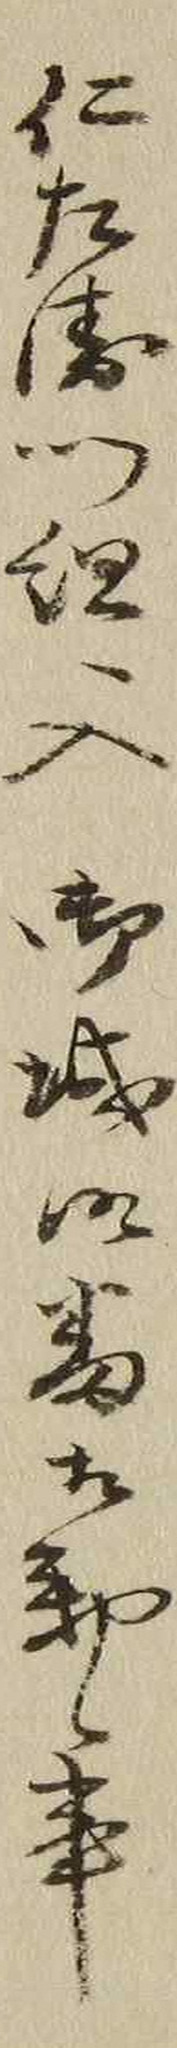仁左衛門組へ入御城御番相勤候事
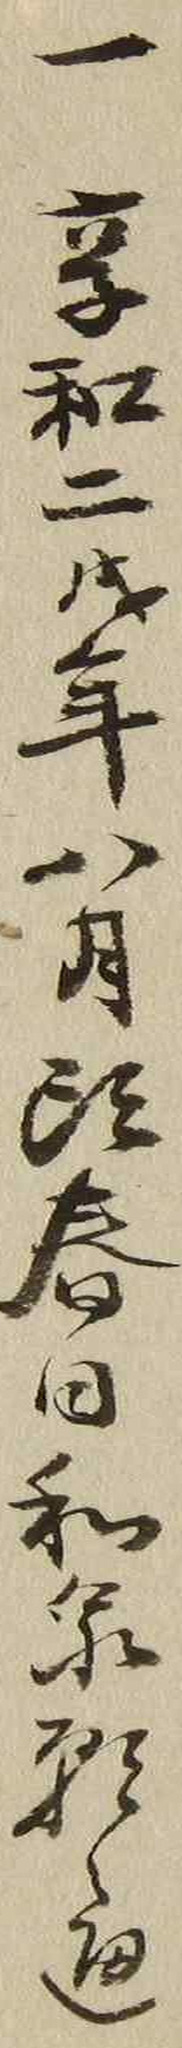一享和二戌年八月頭春日和泉願之通
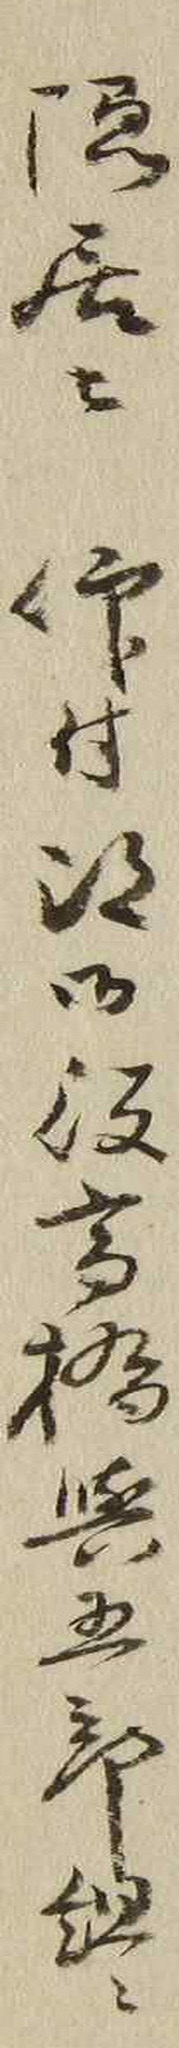隠居被仰付跡御役高橋与五郎組ニ
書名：諸士系譜　巻之232　け之部1
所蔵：会津若松市立会津図書館
